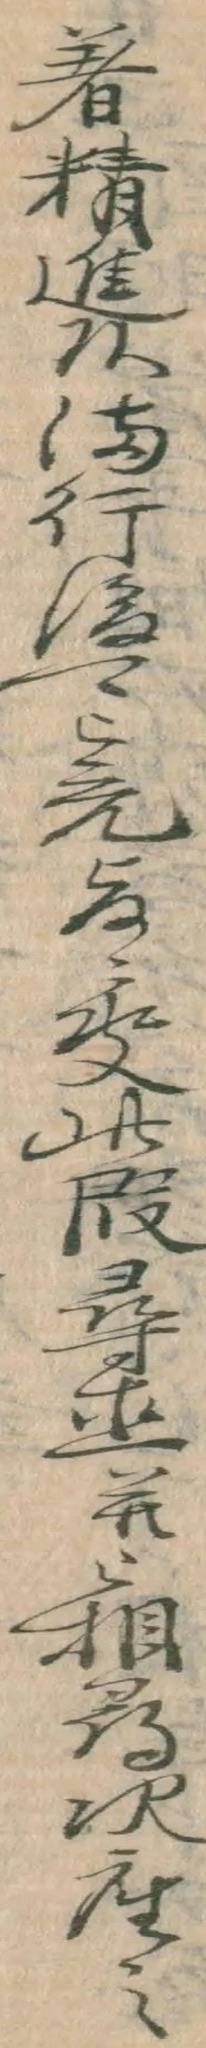着精進候満行後可被充旨ニ決此段尋直并被相尋次座之
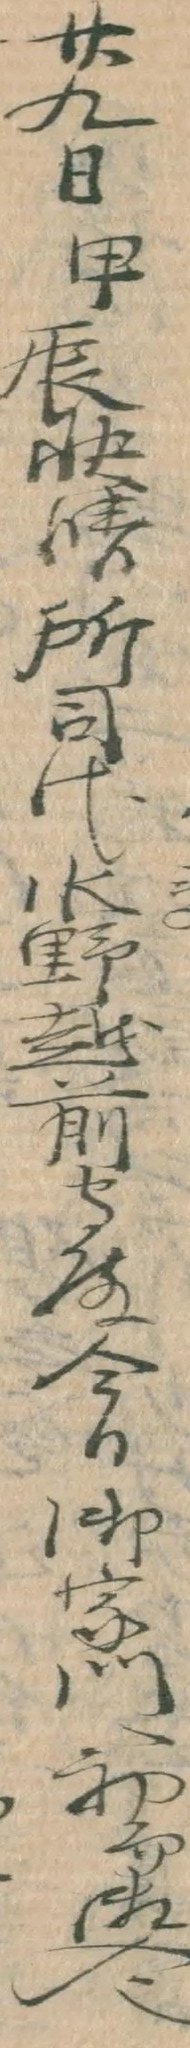廿九日甲辰快晴所司代水野越前守殿今日御家門へ初而御入也
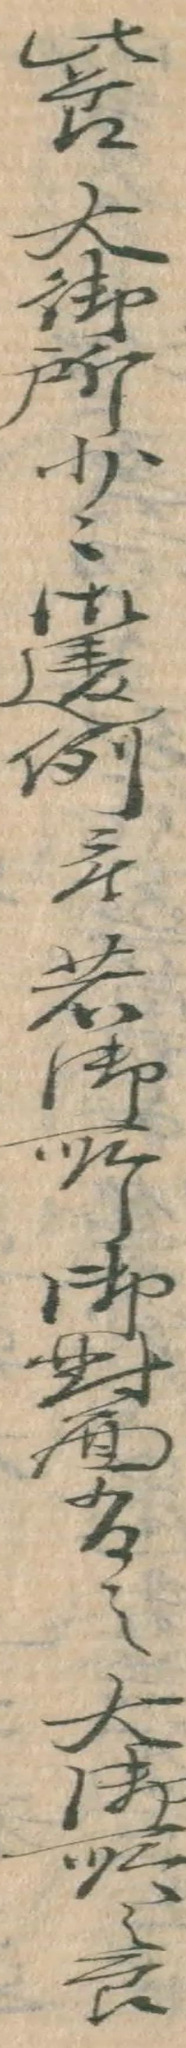此節大御所少々御違例ニ付若御所之御對面有之大御順之節
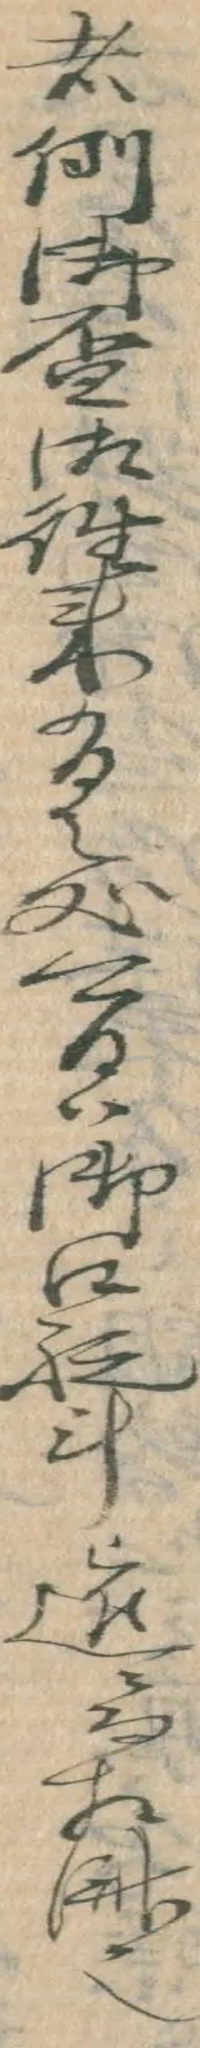者例御盃御往来有之処今日ハ御口祝斗被進ニ而相済候也
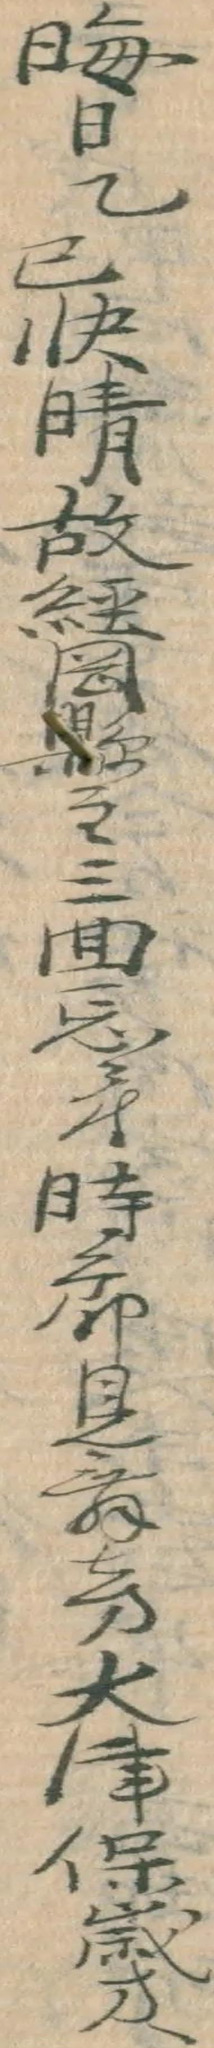晦日乙巳快晴故経岡縣主三回忌ニ付時節見舞旁大津保歳方へ
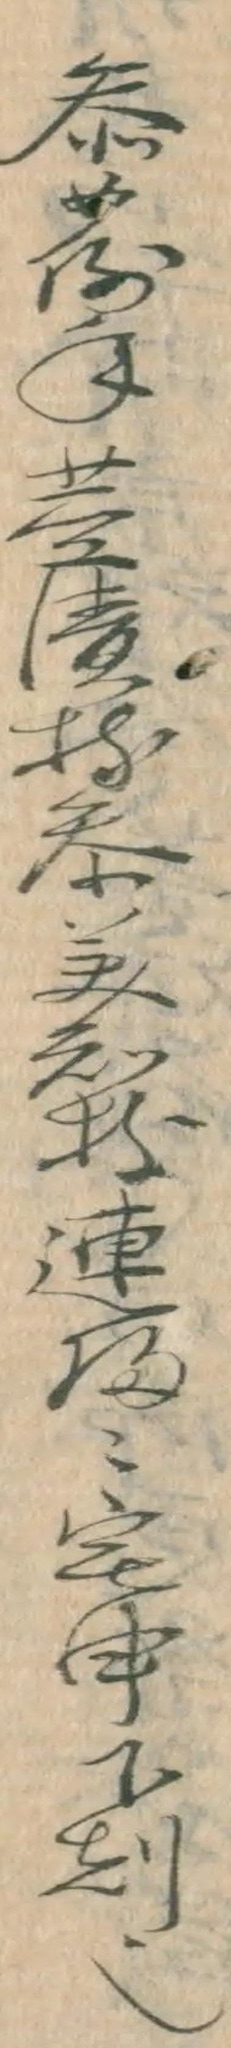参如例年壺漬持参美知枝連帰々宅申下刻也

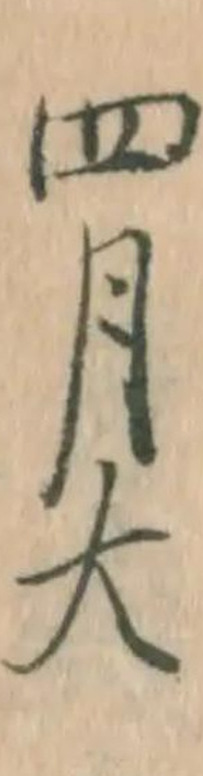四月大
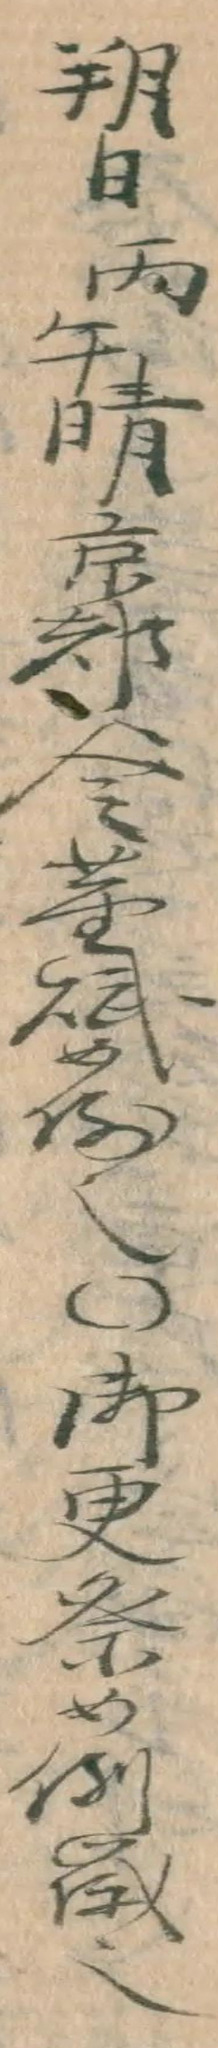朔日丙午晴京都へ令董賦如例也○御更祭如例歳也
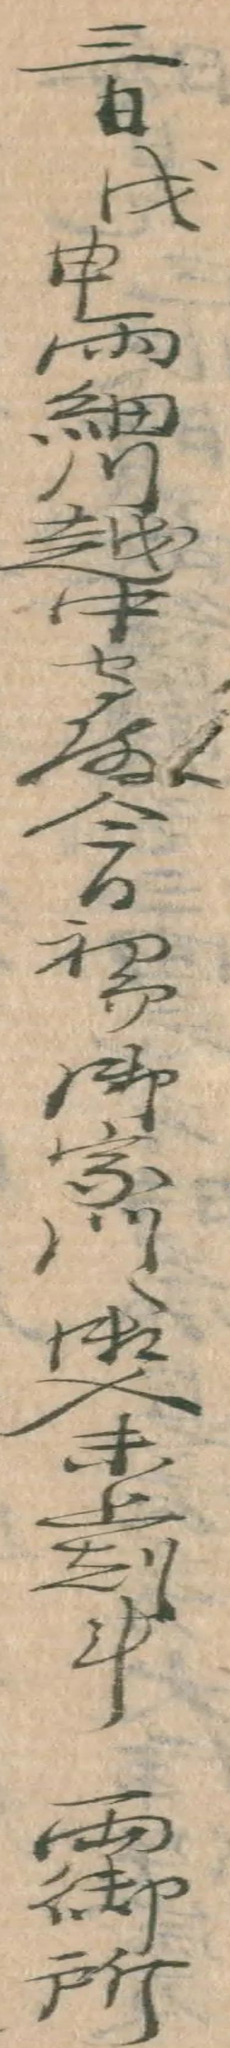三日戊申雨細川越中守殿今日初而御家門へ御入未上刻斗両御所
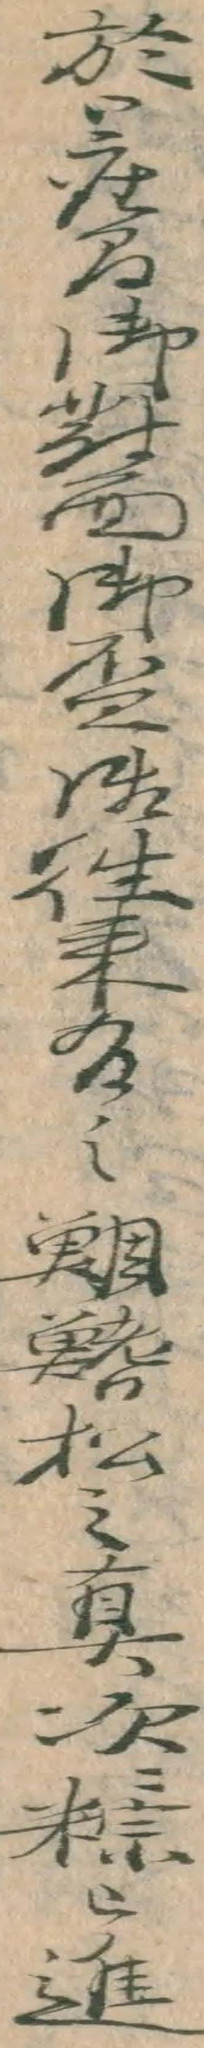於御座間御對面御盃御往来有之鯛鰭松之真次ニ粽被進
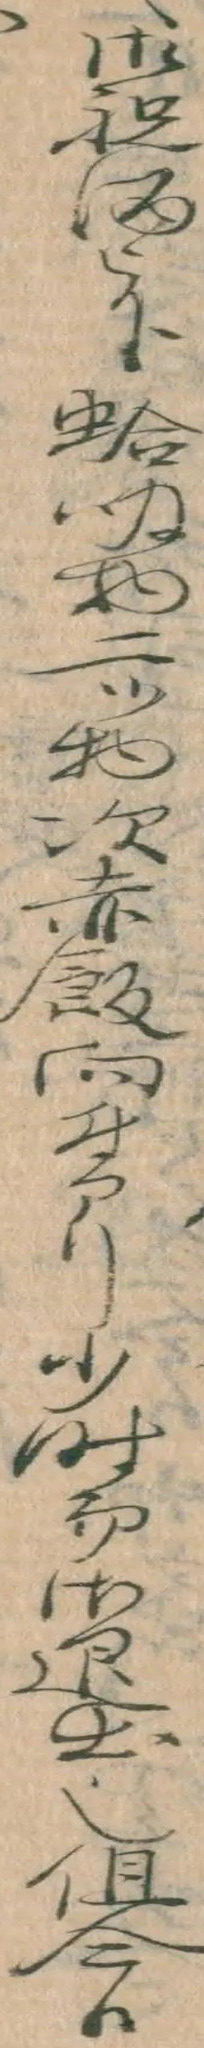へ御祝酒被下蛤吸物二ツ物次赤飯向付アリ少時而御退出也但今日
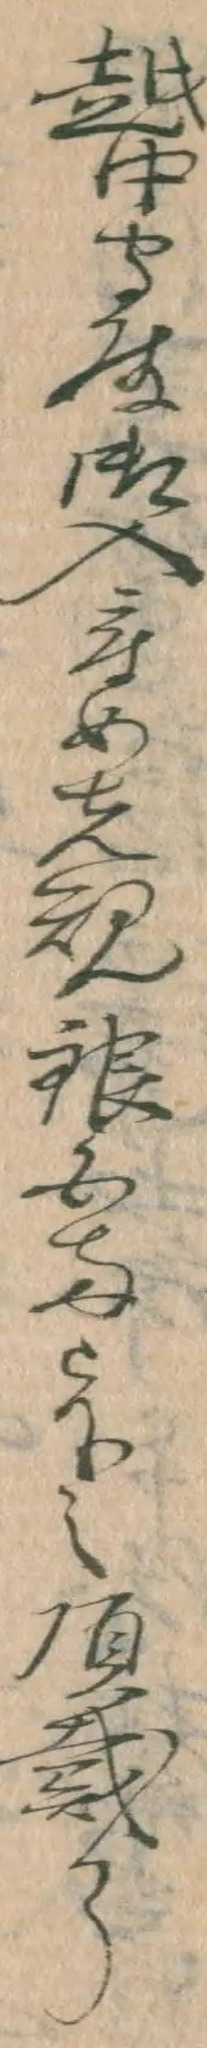越中守殿御入ニ付先規銀五両被下之頂戴了
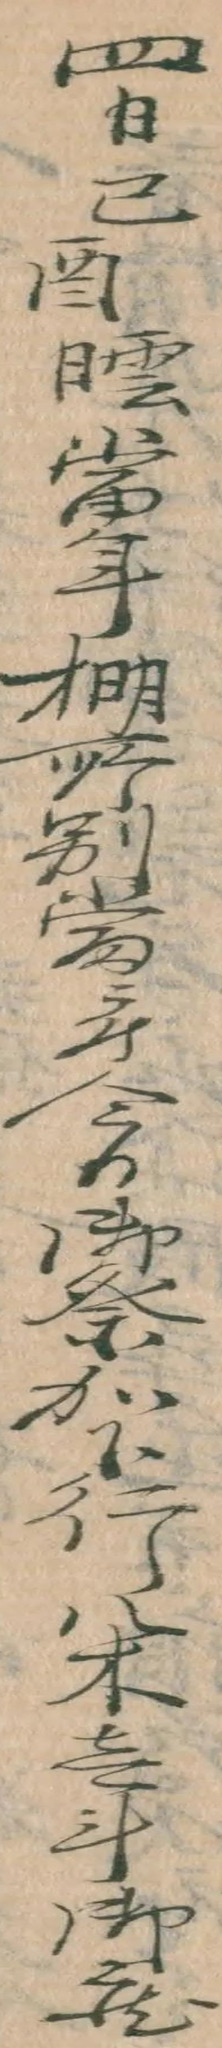四日己酉晴曇當年棚所別當ニ付今日御祭加下行八木壱斗御蔵
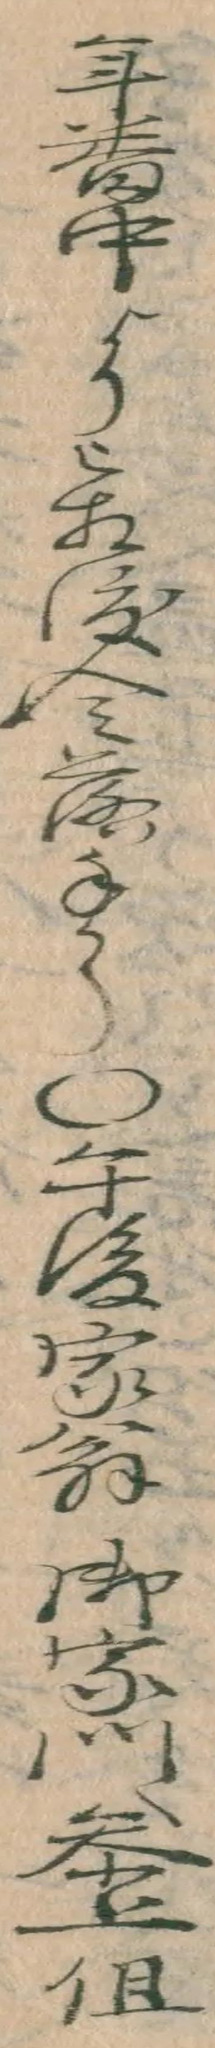年番中より被相渡令落手了○午後家翁御家門へ参上但
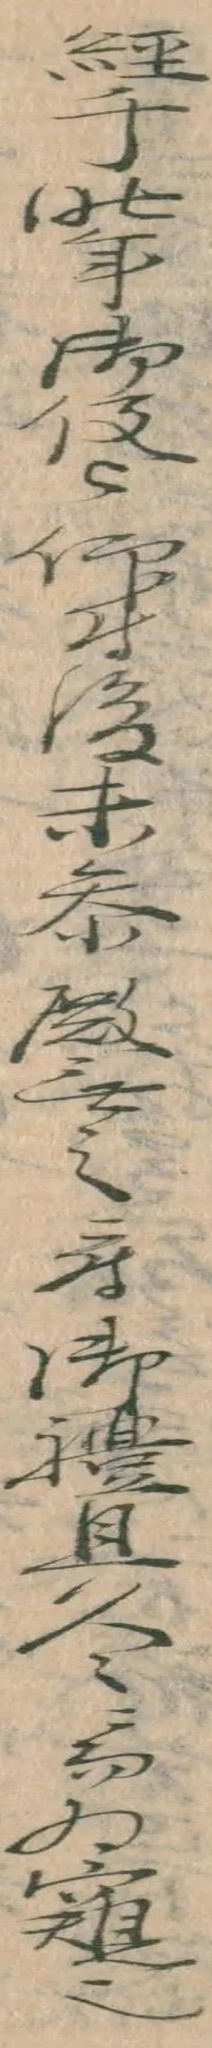経千昨年御役被仰付後未参殿無之ニ付御禮且久々ニ而為窺也
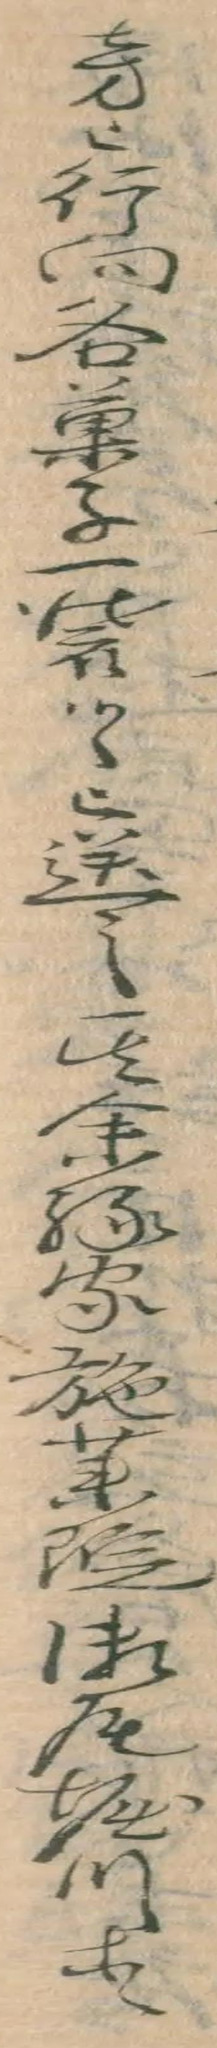旁被行向各菓子一袋ツヽ被送之其余縁家施薬院瀬尾堀川等へ
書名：賀茂社記録. 第65冊
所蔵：国立国会図書館 National Diet Library, JAPAN
